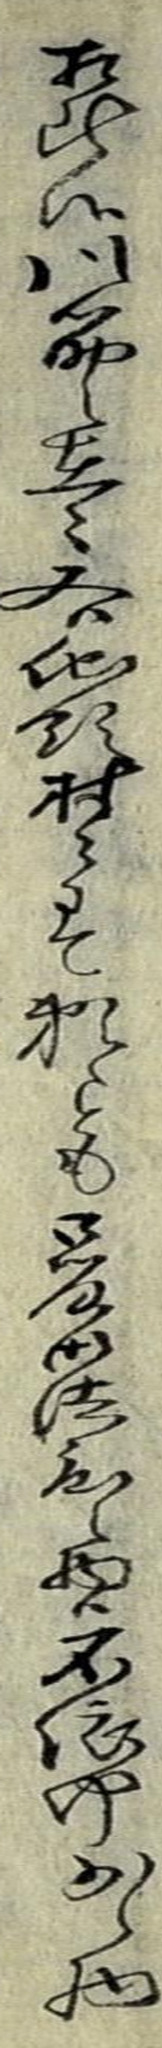相断候川筋之在々又ハ他領村々にて頼候とも口留御法度之物ハ不依何少之物
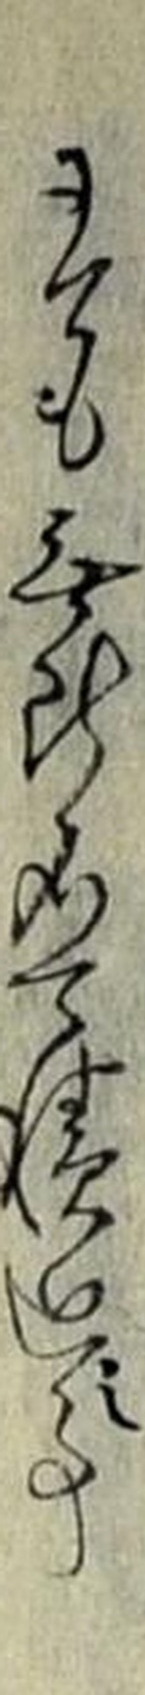にても無断不可積廻之事
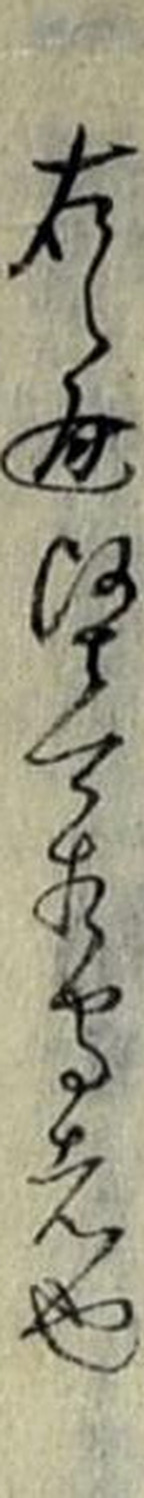右之通堅可相守者也
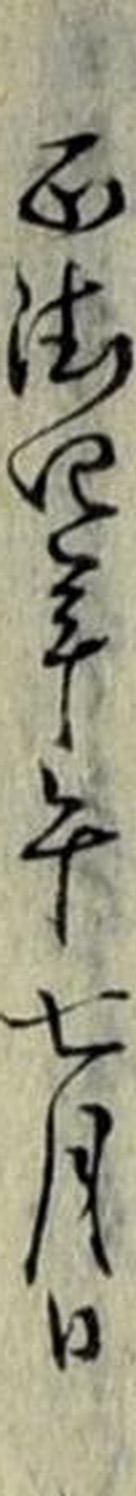正徳四年午七月日
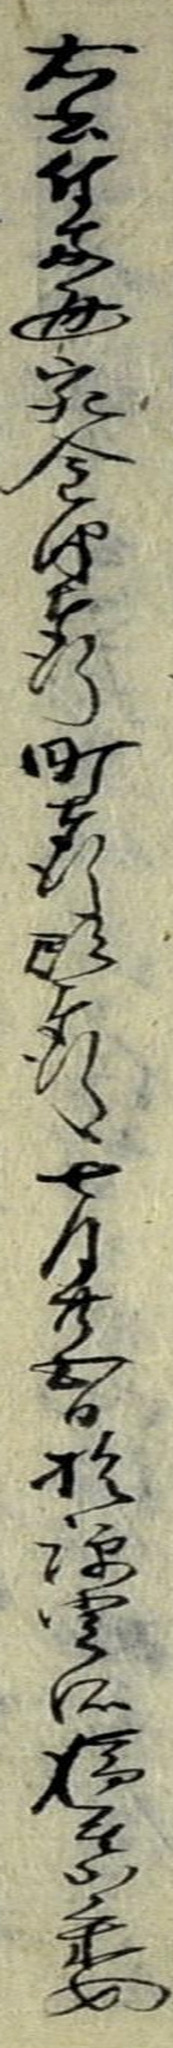右書付両通宛金津奉行町奉行郡奉行へ七月廿五日於評定所稲葉采女
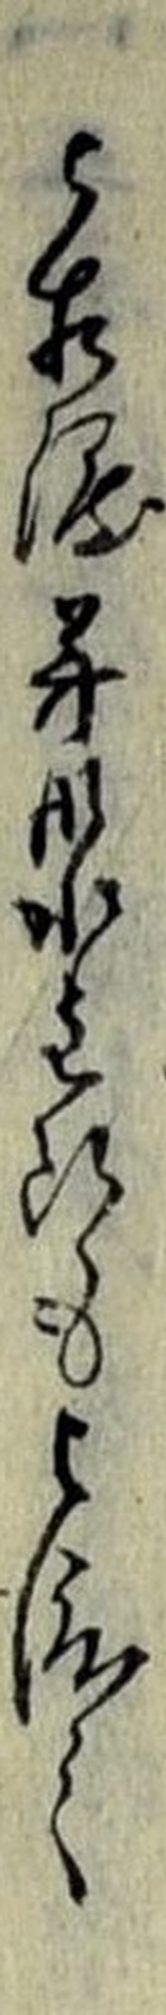被相渡并御水主頭へも被渡之
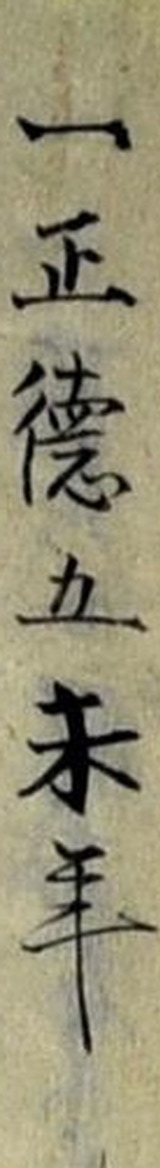一正徳五未年
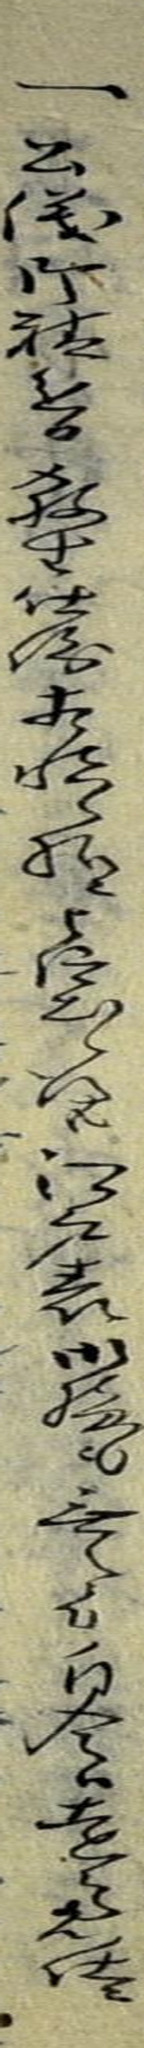一公儀御精進日殺生仕儀相慎候様ニ被仰出候得共江戸表御構も無之ニ付自今ハ遠慮仕ニ
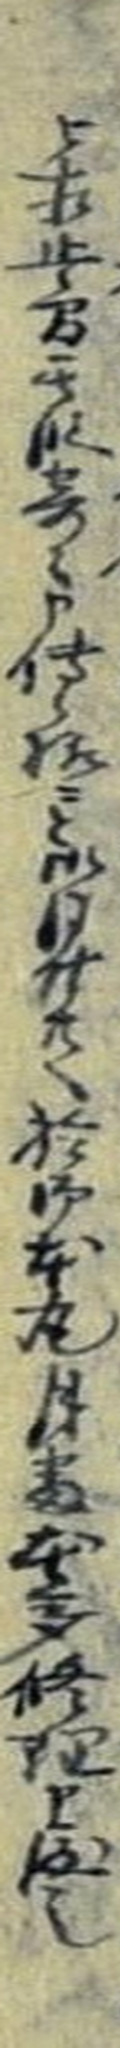被相止候間其段寄々申伝候様ニと御目付共へ於御本丸月番本多修理申渡之
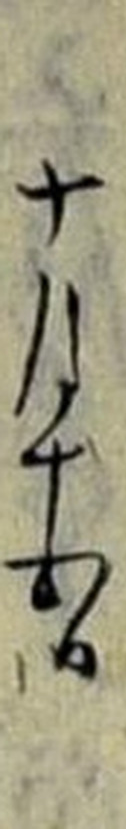十月十五日
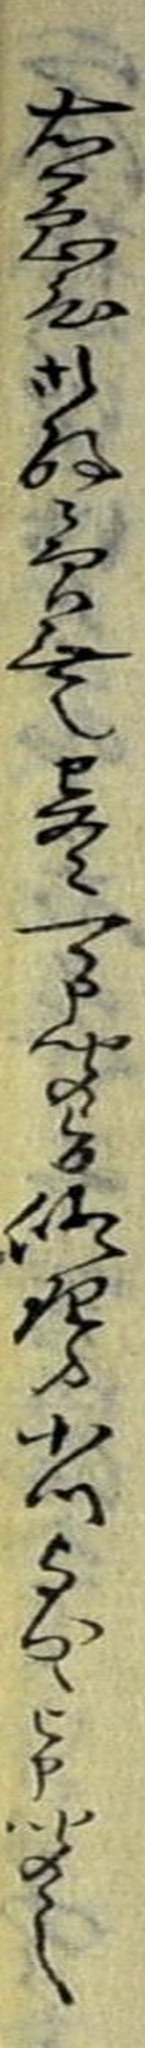右急度御触ニ而ハ無之寄々可申聞旨修理方小川与右衛門へ被申聞之
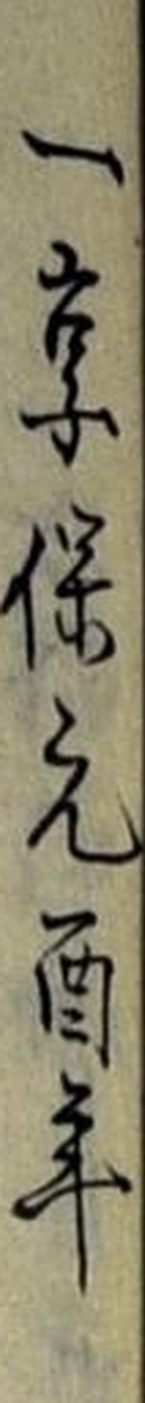一享保元酉年
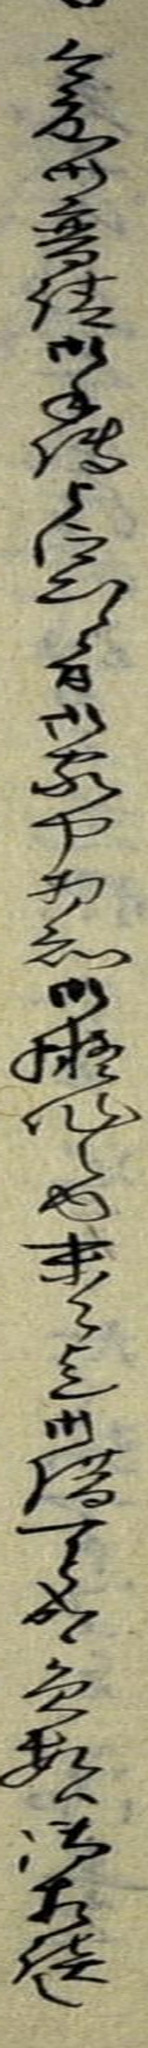〇今度御普請御手伝被仰出候ニ付御家中拝知御擬作之内末々迄御借可被成候免数ハ御相談之
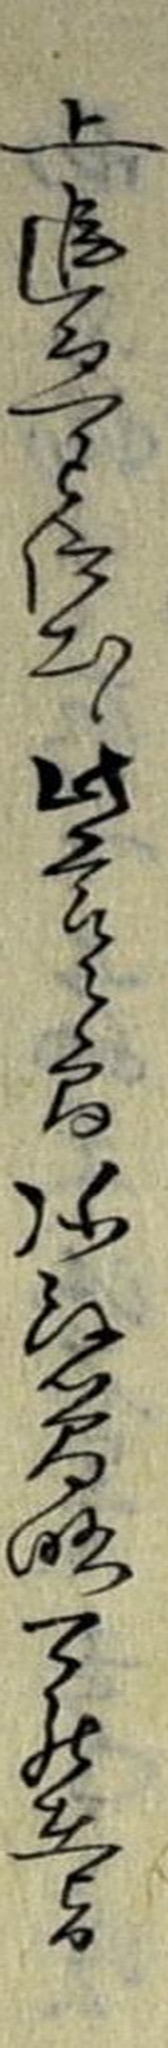上追而可被仰出候此節ニ候間弥致簡略可罷在旨
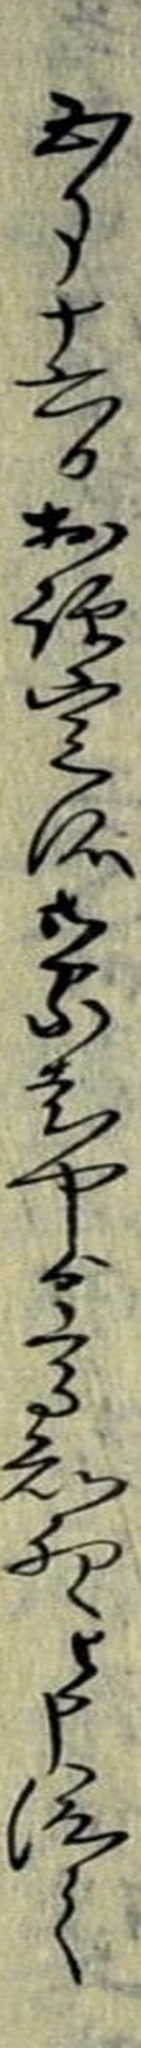五月十六日於評定所御家老中ゟ高知初へ被申渡之
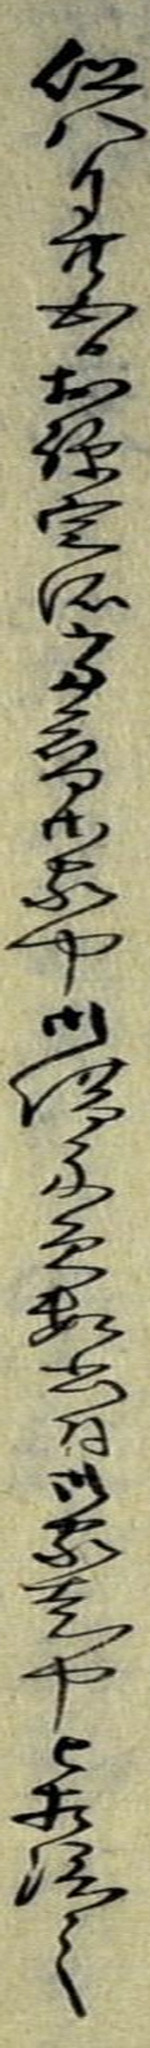但八月廿五日於評定所当暮御家中御借米免数書付御家老中被相渡之
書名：命令之部 一
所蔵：福井県文書館 Fukui Prefectural Archives
